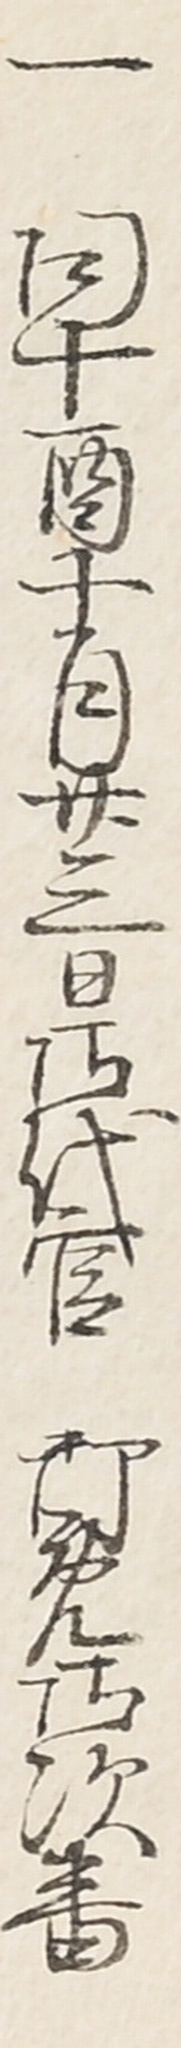一同十酉十月廿三日御代官御免御次番
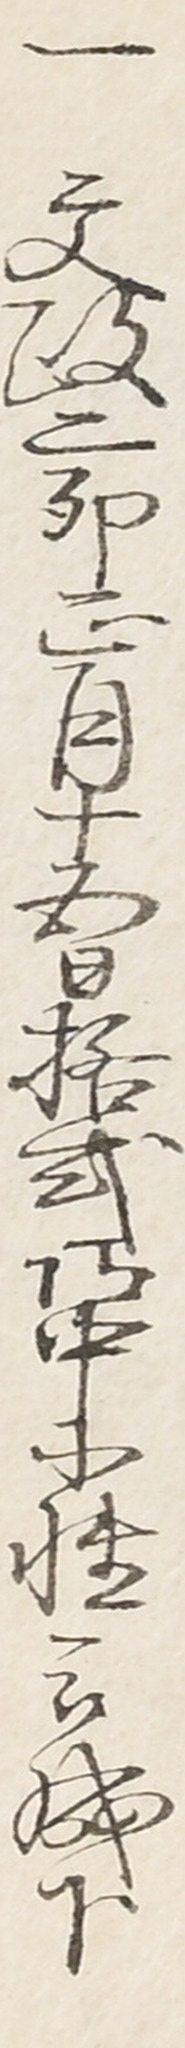一文政二卯正月十五日格式御中小性被成下
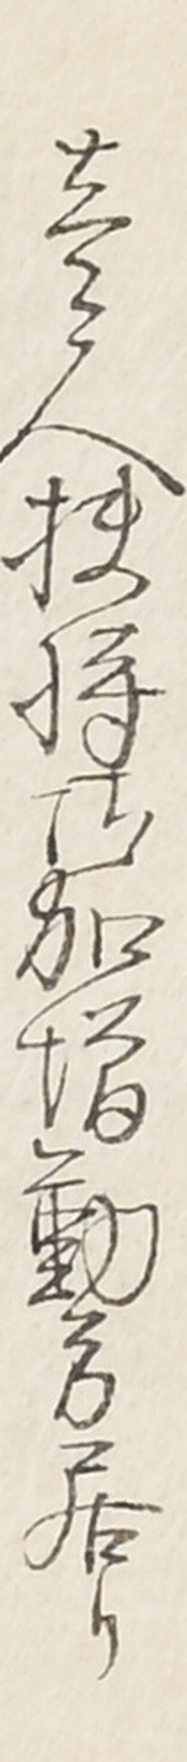壱人扶持御加増勤方居り
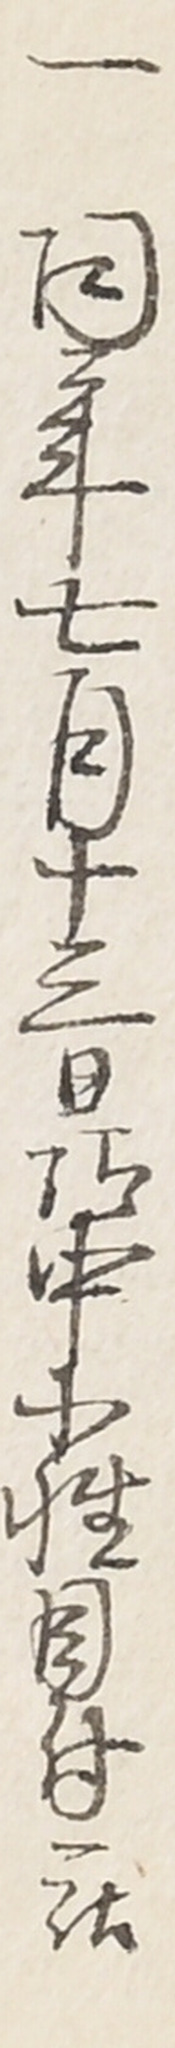一同年七月十三日御中小性目付被
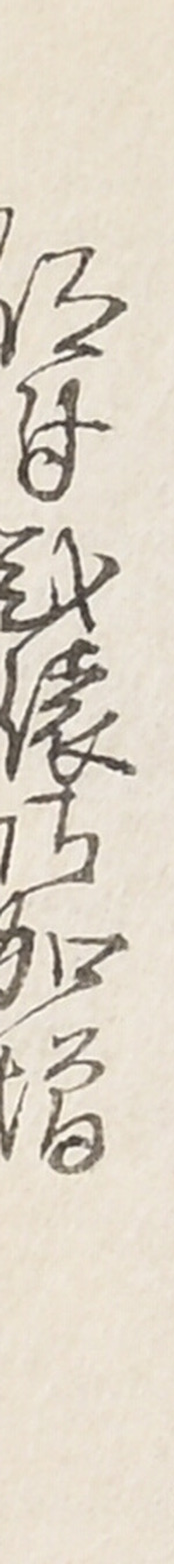仰付弐俵御加増
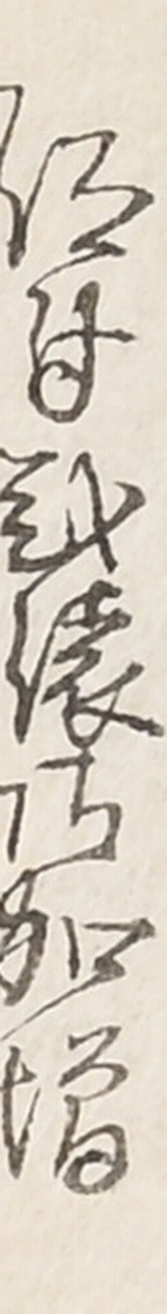仰付弐俵御加増
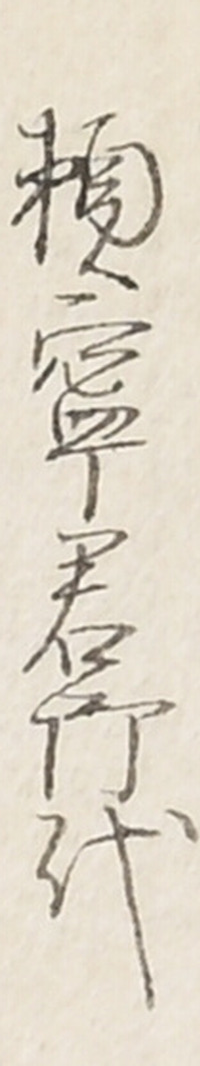頼寧君御代
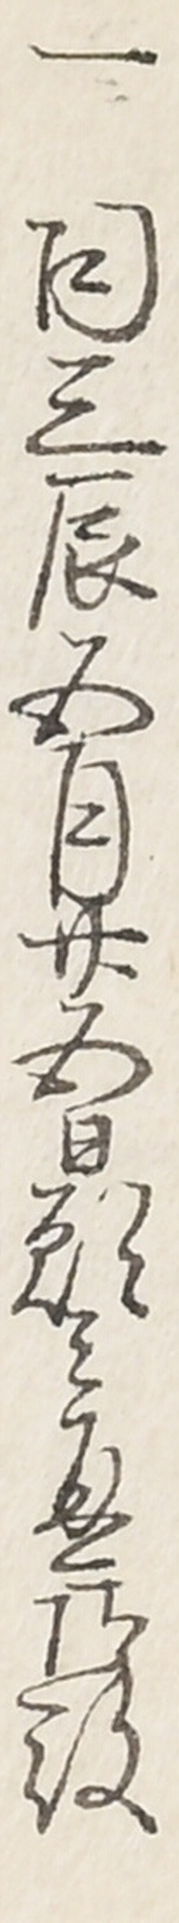一同三辰五月廿五日願之通御役
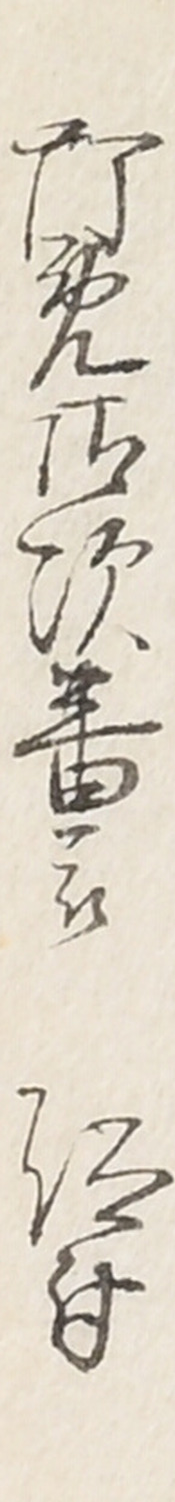御免御次番被仰付
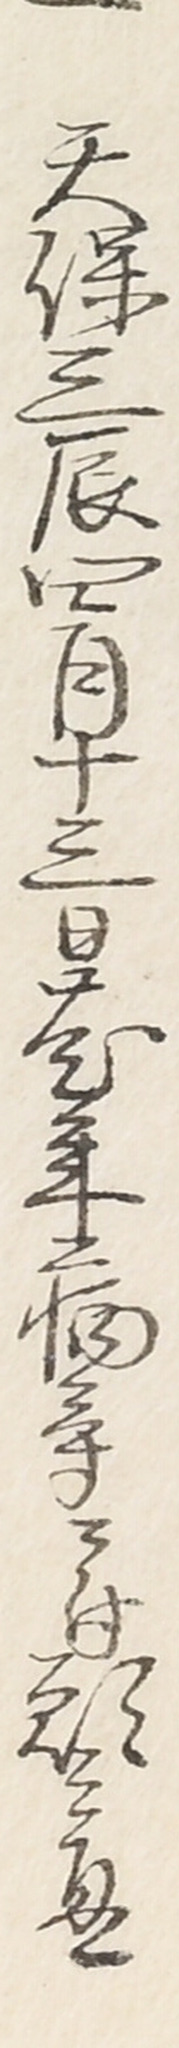一天保三辰四月十三日老年病気ニ付願之通
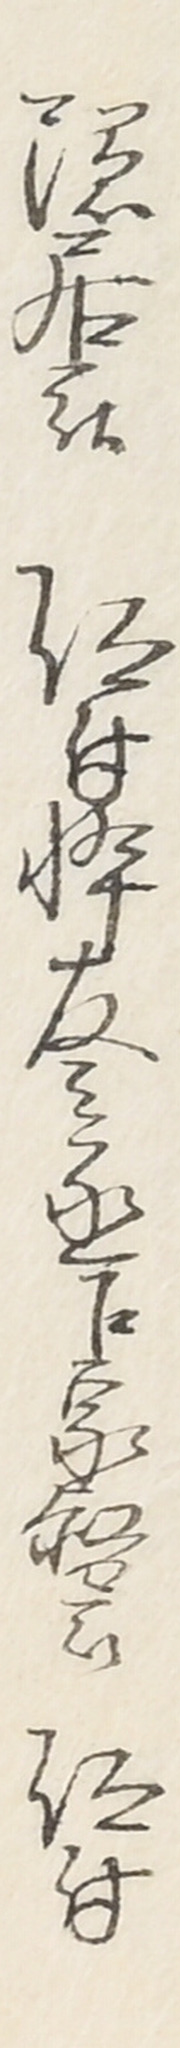隠居被仰付忰友之丞江家督被仰付
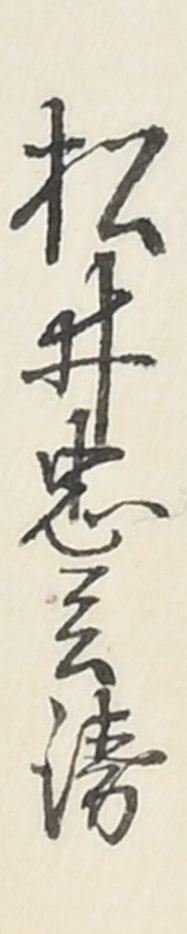松井忠兵衛
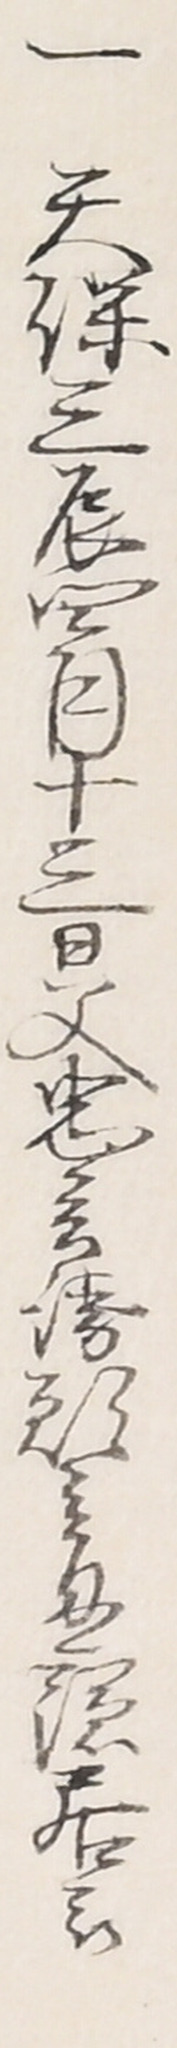一天保三辰四月十三日父忠兵衛願之通隠居被
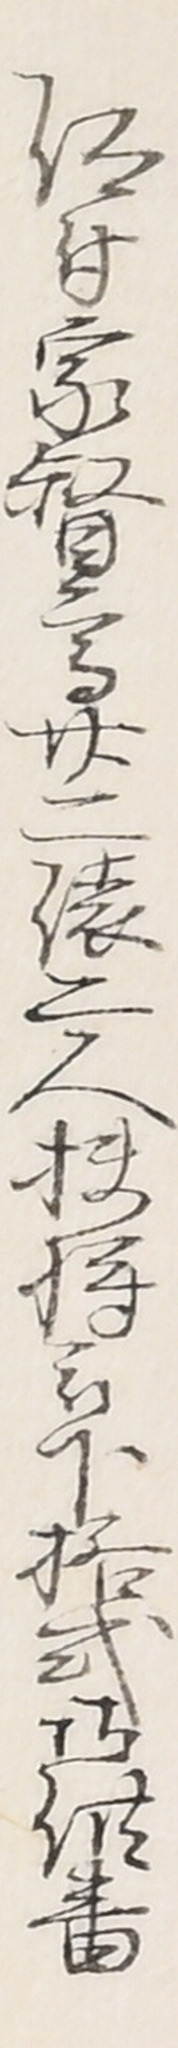仰付家督高廿二俵二人扶持被下格式御供番
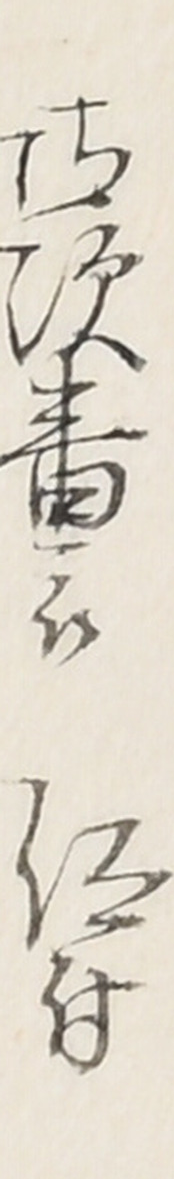御次番被仰付
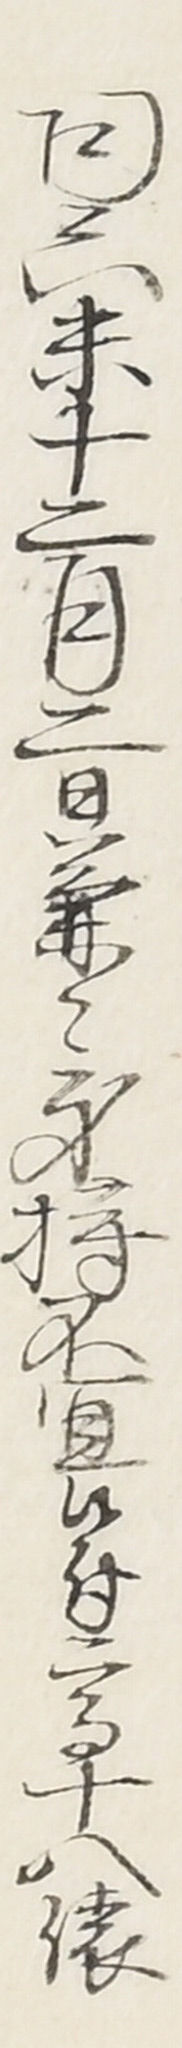一同六未十二月二日兼々身持不宜候付高十八俵
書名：無足諸士勤仕録（四）
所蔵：伊那市立高遠町図書館・合同会社AMANE
